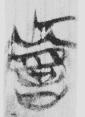誨
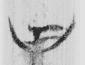曰
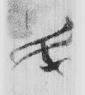民
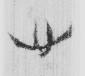心
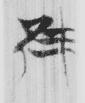隹
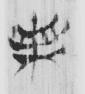本B（本）
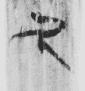氒
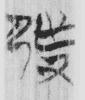{人乍又}
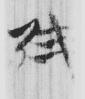隹
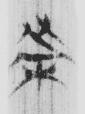枼
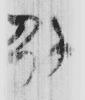引
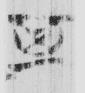𠀠
